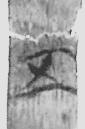五
